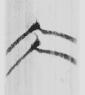大
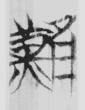難
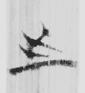之
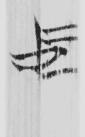𠁩
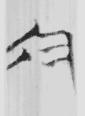今
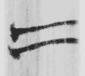二
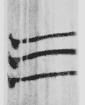三
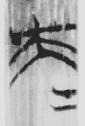夫=
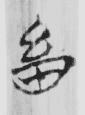畜
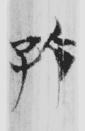孤
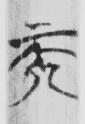而
